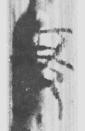史
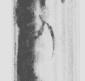人
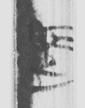麥
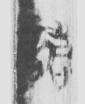請
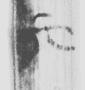亓
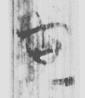故
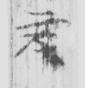不
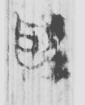聖
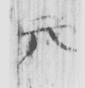亓
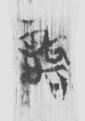詒
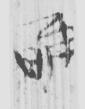唯
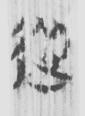從
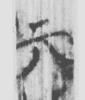亓
